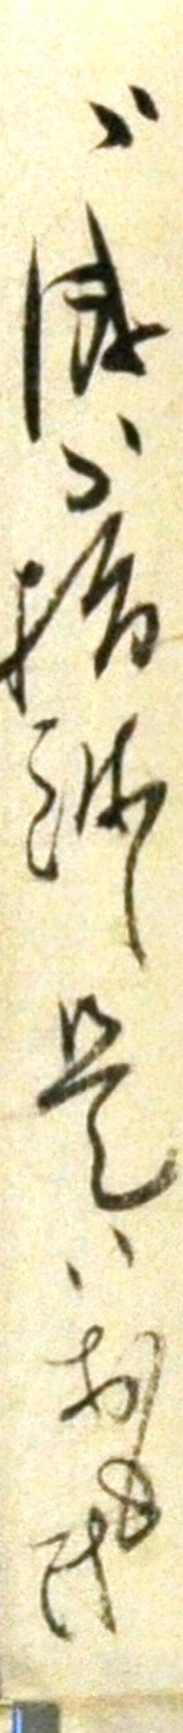被成被指越候是はおも
